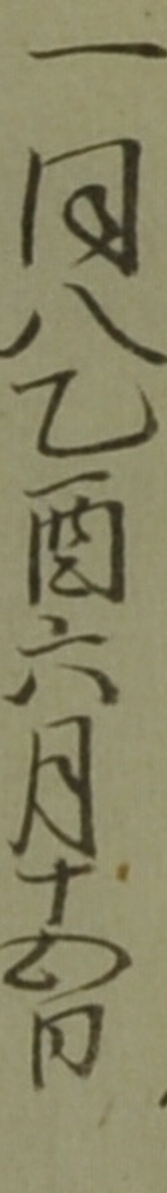一同八乙酉六月十五日
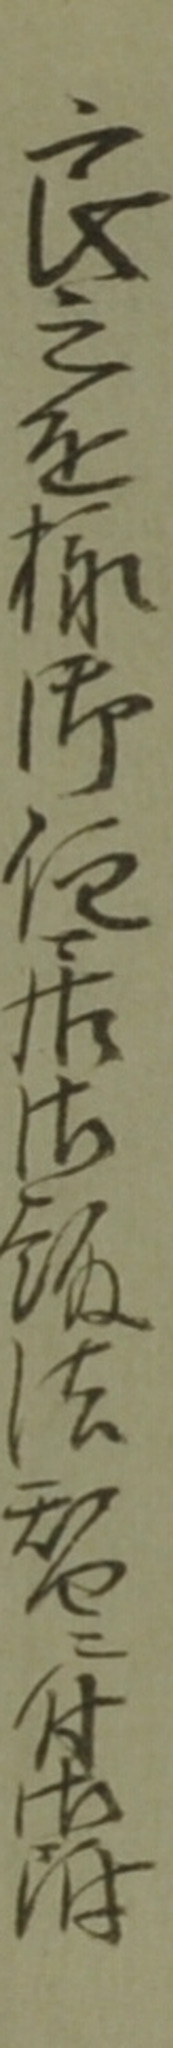良之進様御住居御趣法替ニ付御附
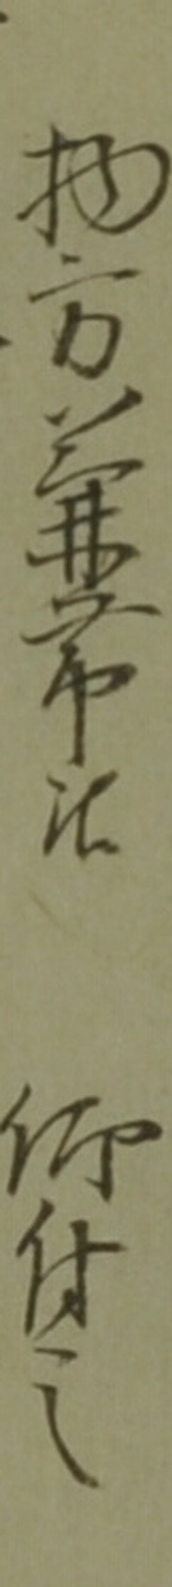物方兼帯被仰付之
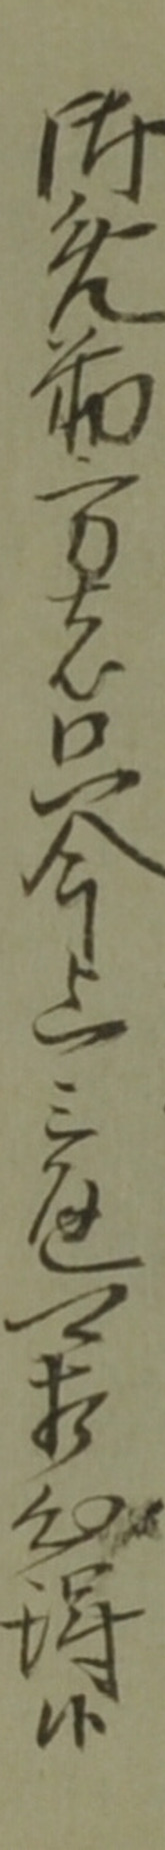御免勤方者只今迄之通可相心得候
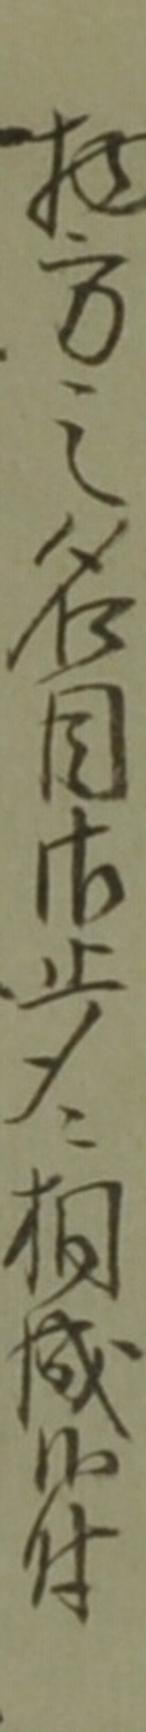物方之名目御止メニ相成候付
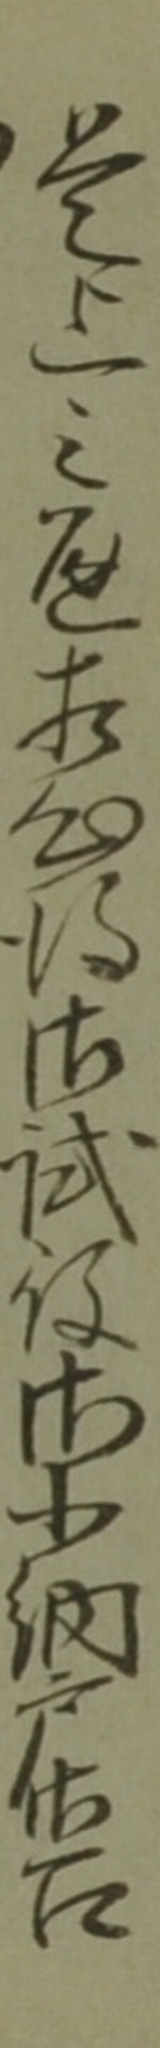其上之通相心得御試役御小納戸御召
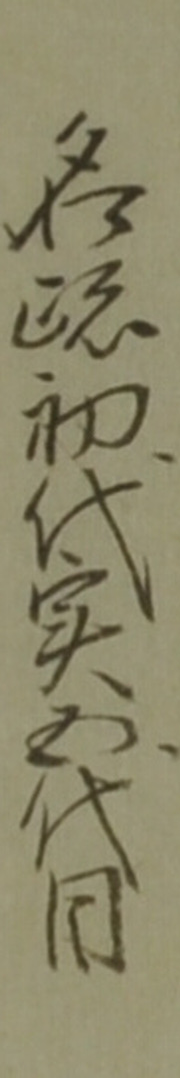名跡初代実五代目
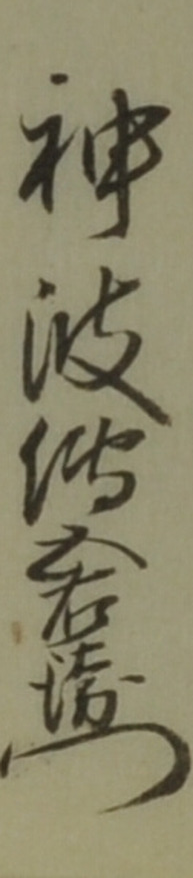神波伝五右衛門
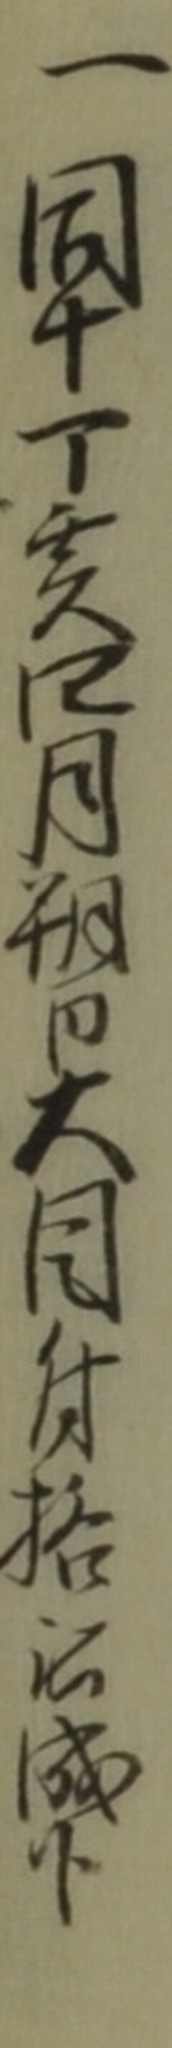一同十丁亥四月朔日大目付格被成下
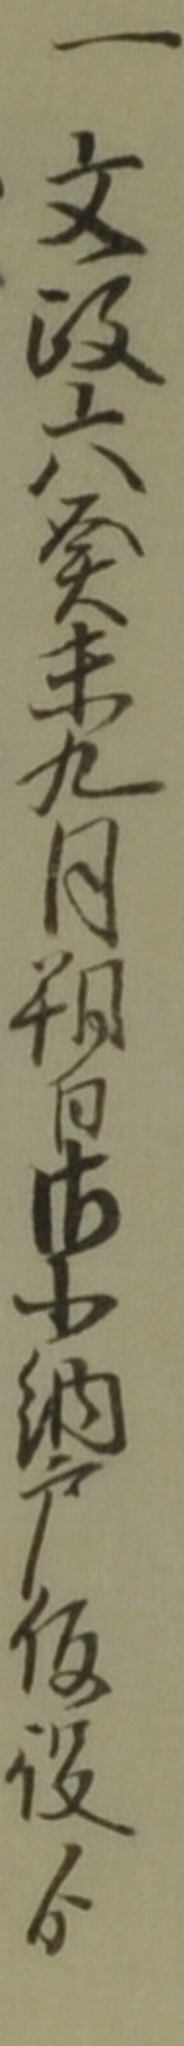一文政六癸未九月朔日御小納戸仮役ゟ
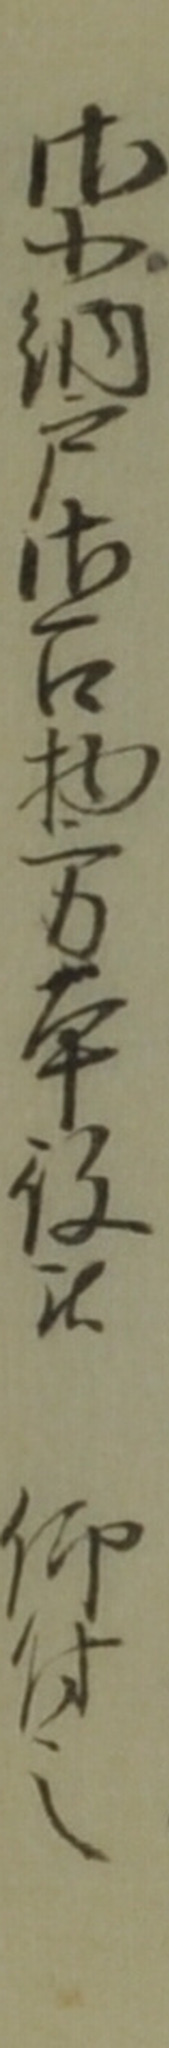仰付小納戸御召物方本役被仰付之
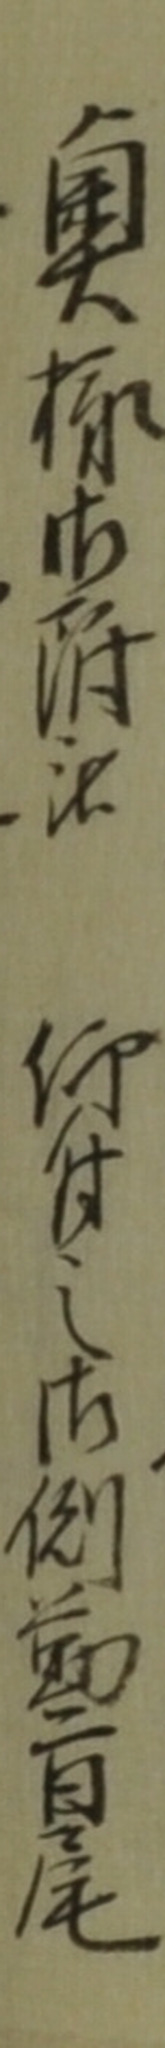奥様御附被仰付之御側勤首尾
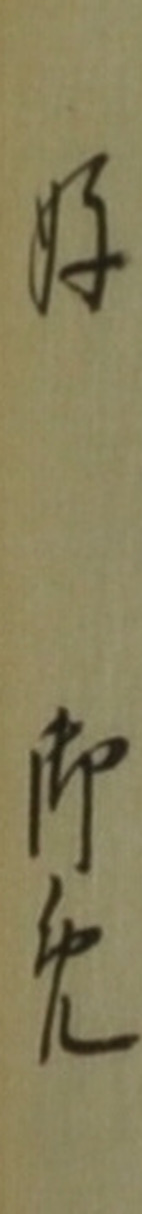好御免
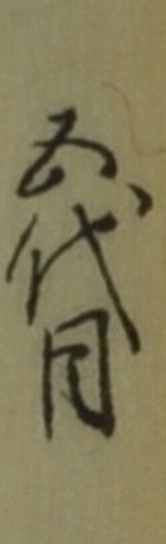五代目
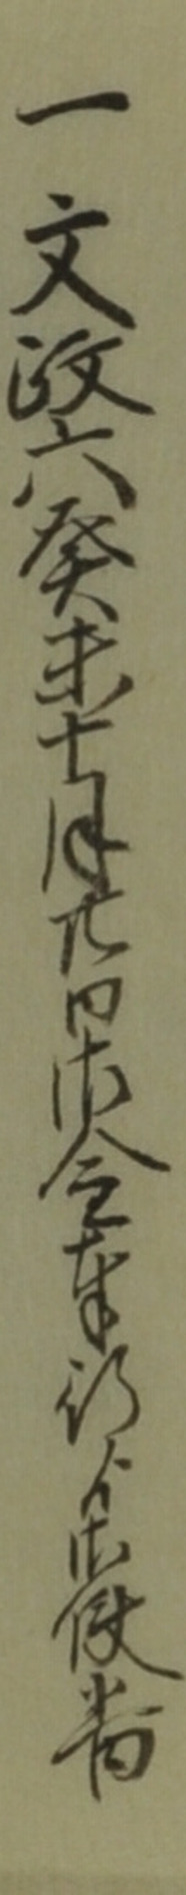一文政六癸未十月廿日御金奉行ゟ御使番
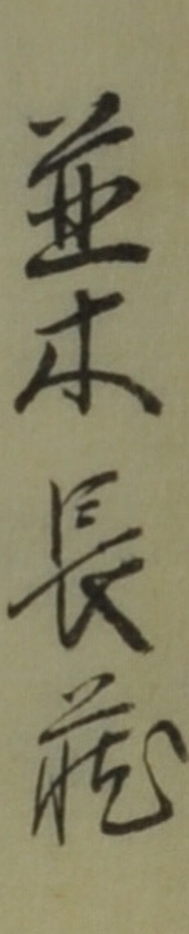並木長蔵
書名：諸御役代々録（四）
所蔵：伊那市立高遠町図書館・合同会社AMANE
